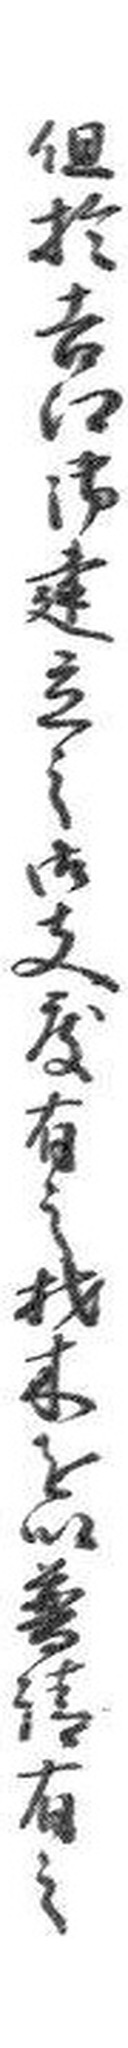但吉江御建立之御支度有之材木を以普請有之
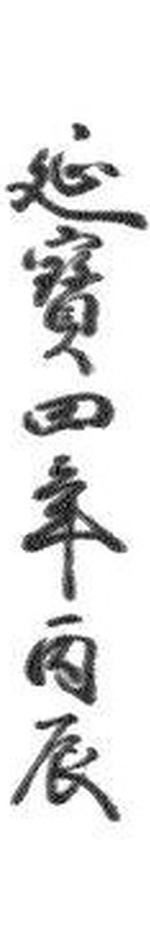延宝四年酉辰
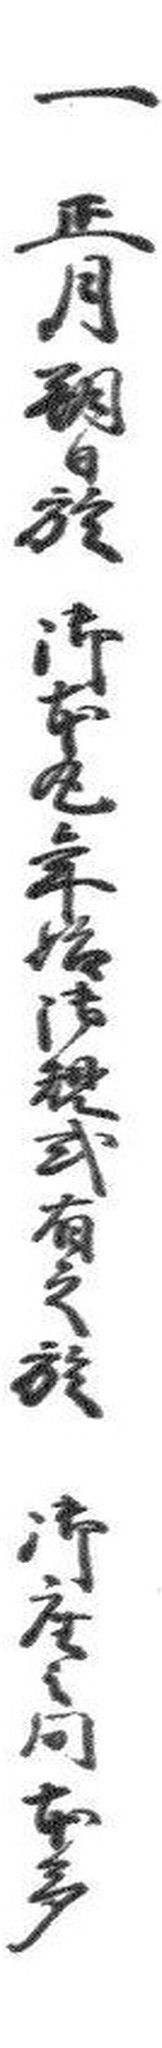一正月朔日於御本丸年始御規式有之於御座之間本多御礼
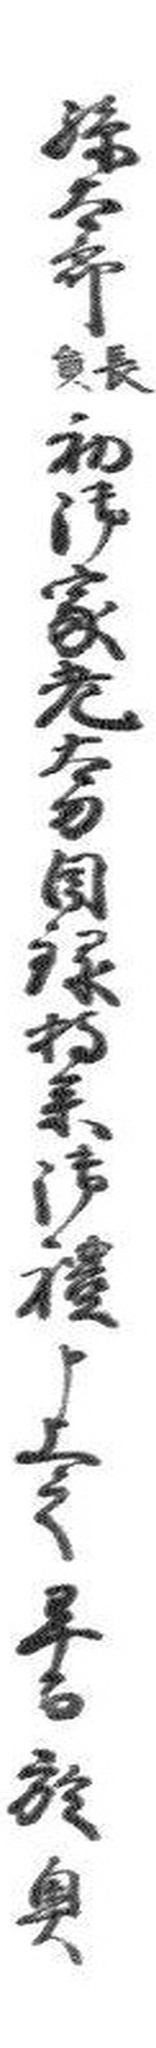孫太郎長員初御家老太刀目録持参御礼申上之畢而於奥
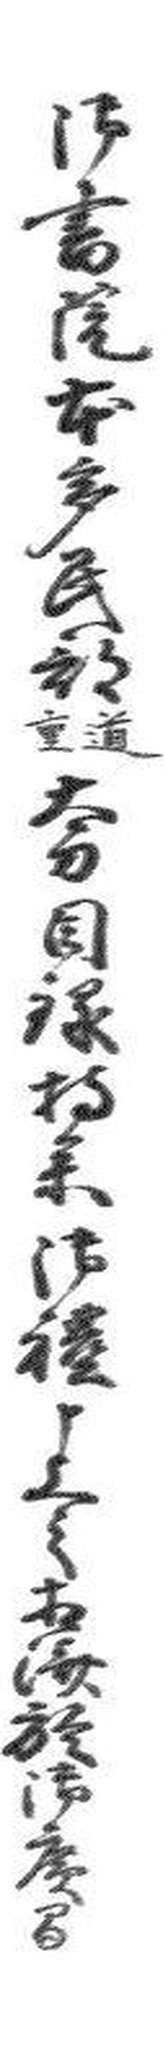御書院本多民部道重太刀目録持参御礼申上之相済於御座間
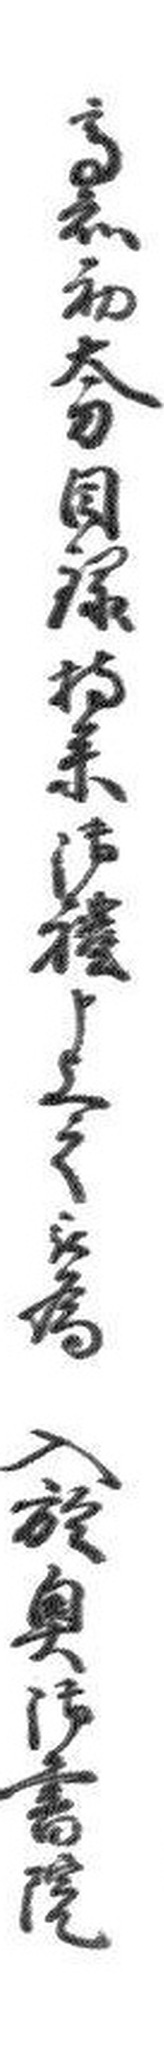高知初太刀目録持参御礼申上之被為入於奥御書院
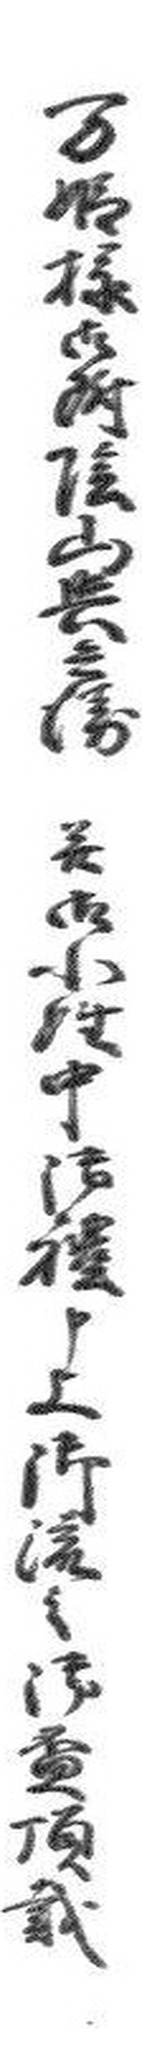万姫様御附隂山与兵衛幷御小姓中御礼申上御流之御盃頂戴
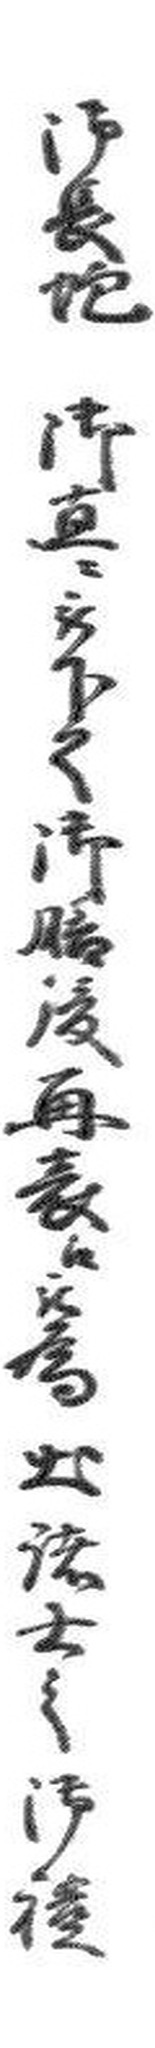御長蚫御直ニ被下之御膳後再表江被出諸士之御礼
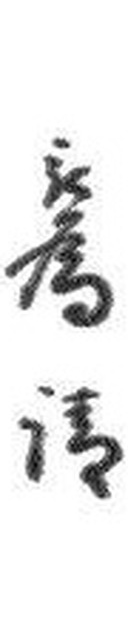被為請

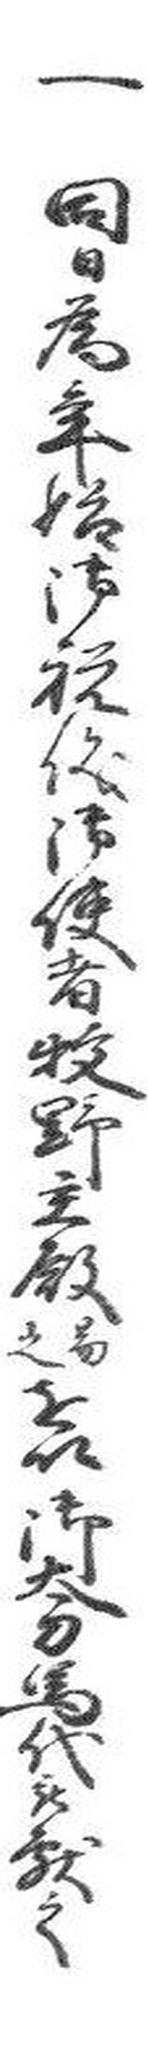一同日為年始御祝儀御使者牧野主殿易之を以御太刀馬代被献之
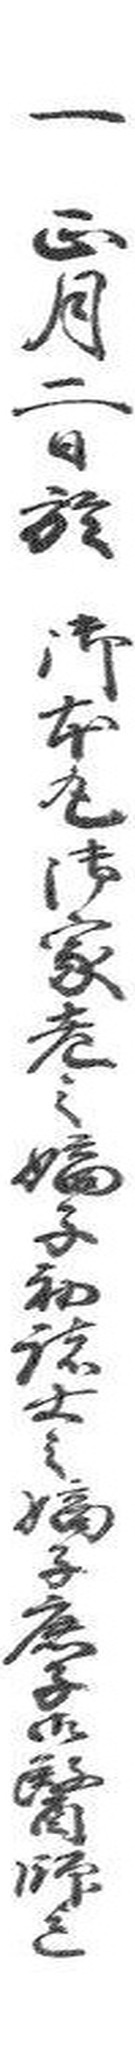一正月二日於御本丸御家老之嫡子初諸士之嫡子庶子御医師迄
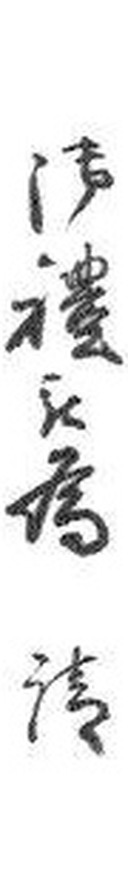御礼被為請
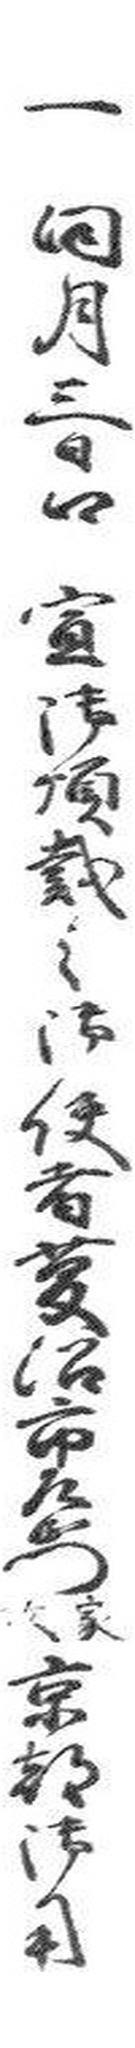一同月三日宜御頂戴之御使者菱沼市左衛門家次京都御用
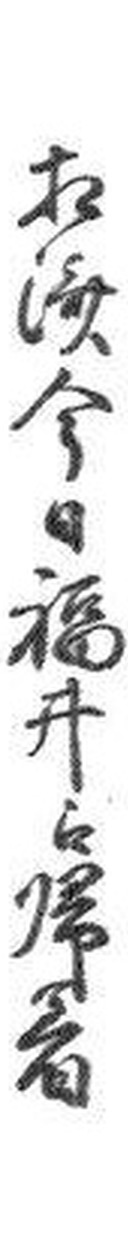相済今日福井江帰着
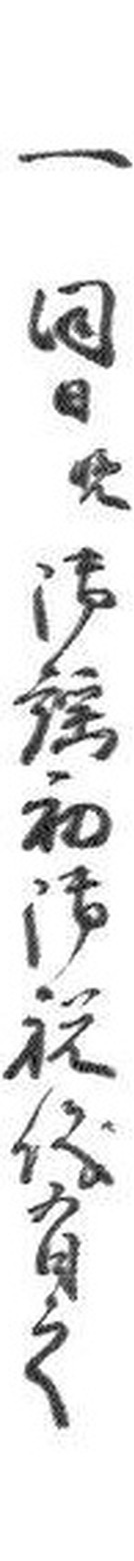一同日晩御謡初御祝儀有之
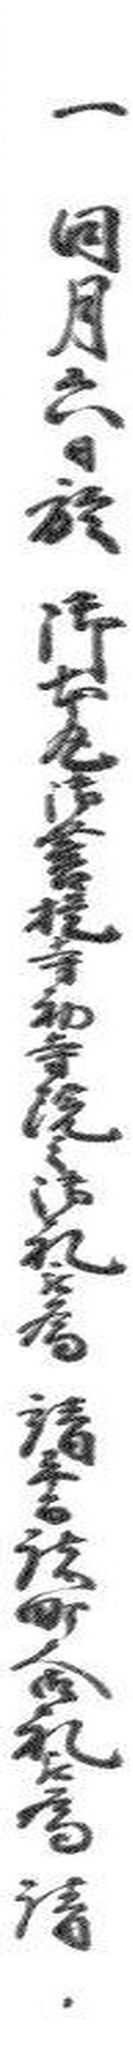一同月六日於御本丸御菩提寺初寺院之御礼被為請畢而諸町人御礼
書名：家譜 十一 昌親公 従延宝二年到延宝四年八月
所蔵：福井県文書館 Fukui Prefectural Archives
